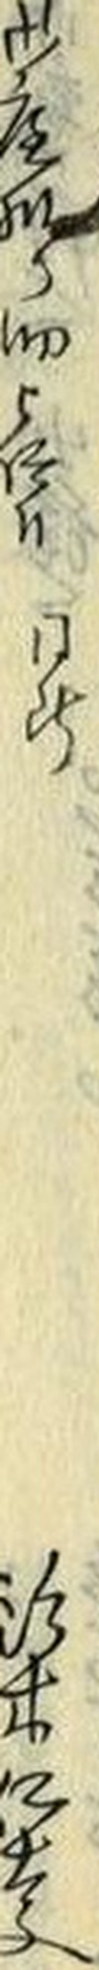御庭掛り助被仰付同断鈴木仁太夫
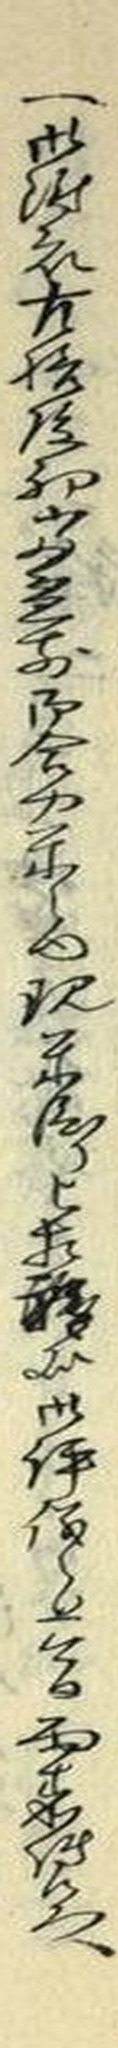一御附衆左膳殿初当盆前御合力米之内現米渡り被相願候処御評議之上今日雨森伝左衛門へ
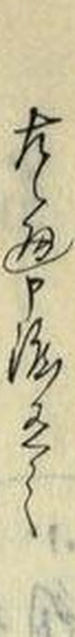左之通申渡有之
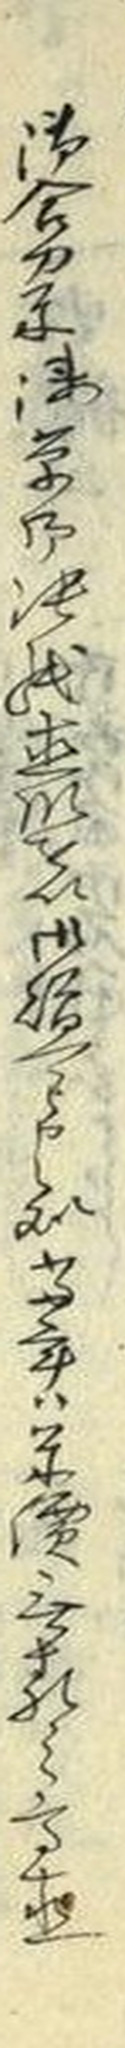御合力米浅草御張紙直段を以御贈可被申候処当年ハ米価無類之高直
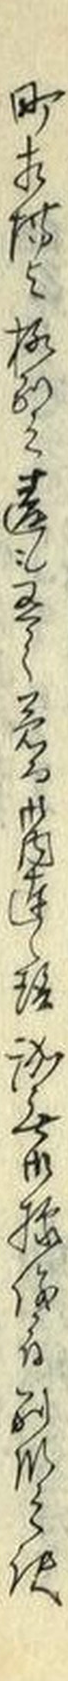町相場与格別之違も有之兼而御内達之趣誠無御拠儀ニ付別段之訳
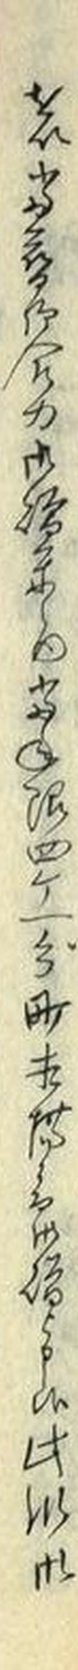を以当暮御合力御贈米之内当年限四ケ一分町相場ニ而御贈被申候此段御
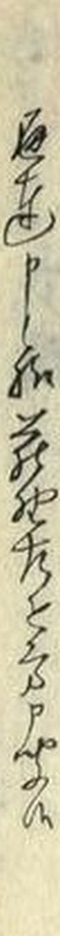通達申候様荻野左近方申聞候
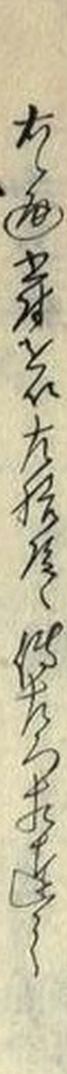右之通書付を以左膳殿へ伝左衛門相達之
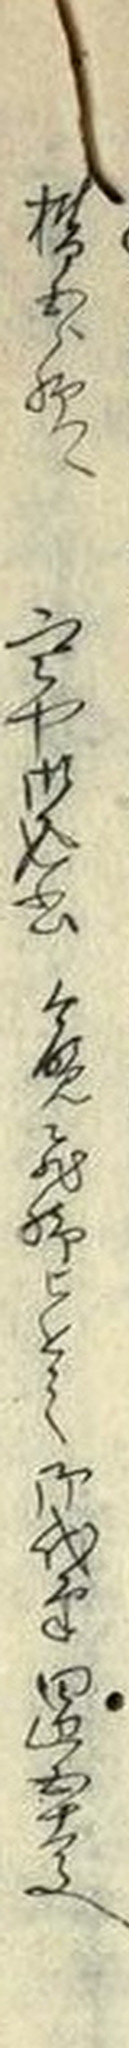楷五郎様へ寒中御返書今晩飛脚被進之御代筆田辺五太夫
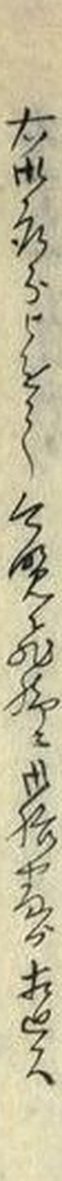右御取分被進之今晩飛脚ニ御膳番ゟ相廻ス
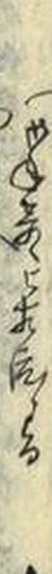御年寄へ被相渡候旨

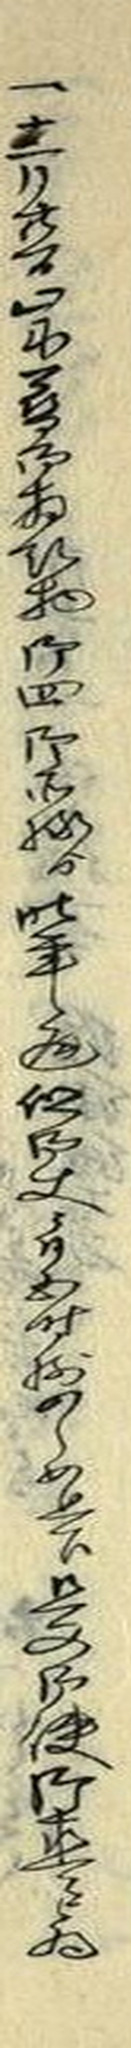一十二月廿一日歳暮御拝領物御四御所様ゟ昨年之通但御使ニ付五時揃のしめ上下且又御使御直ニ被為
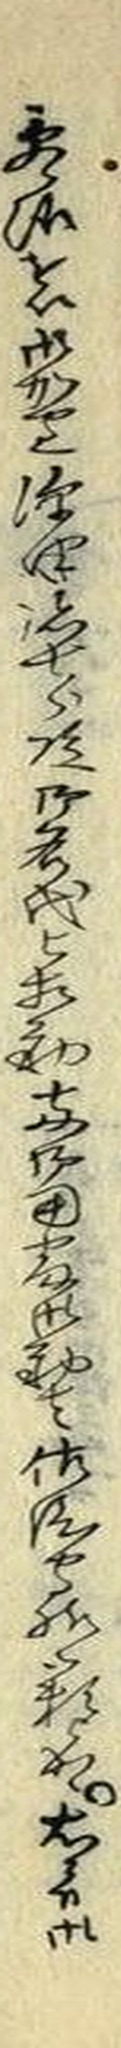受候趣を以御加宜深津弥七郎殿御名代被相勤両御用番御勤者佐渡守様御頼被成候右ニ付御
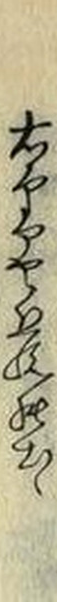右筆部屋へ恐悦罷出候
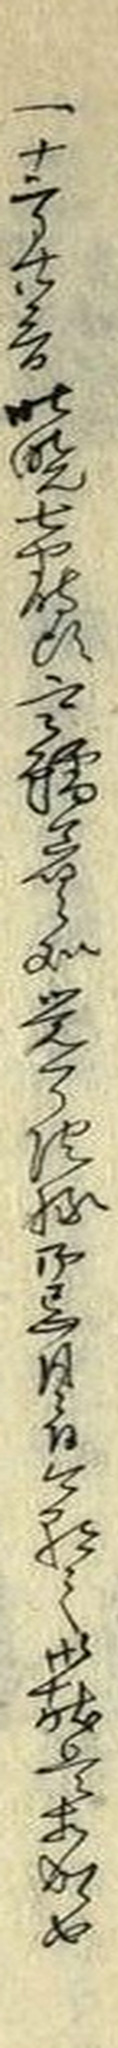一十二月廿三日昨晩七半時頃寒鱈着之処覚了院様御忌日ニ付今朝之御献上ニ相成候由
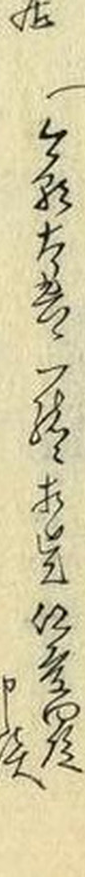今朝大奥へ一緒ニ相廻ス但藤田殿申談
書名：少傅日録抄（斉善付側向頭取日記、在府）
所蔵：福井県文書館 Fukui Prefectural Archives
